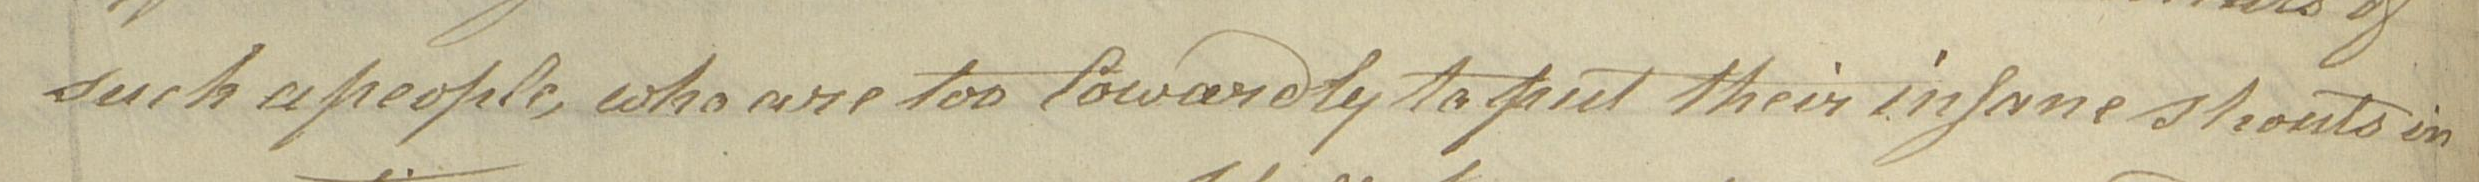such a people, who are too Cowardly to put their insane shouts in
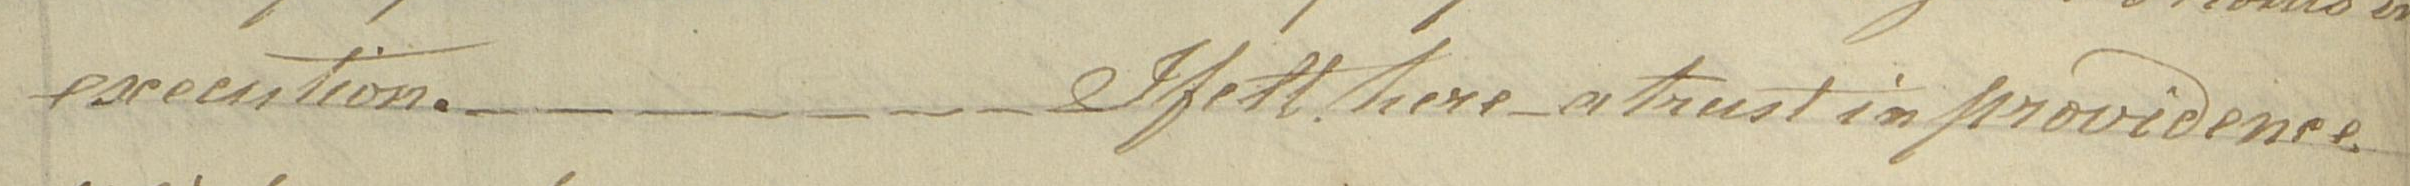execution. I felt here a trust in providence
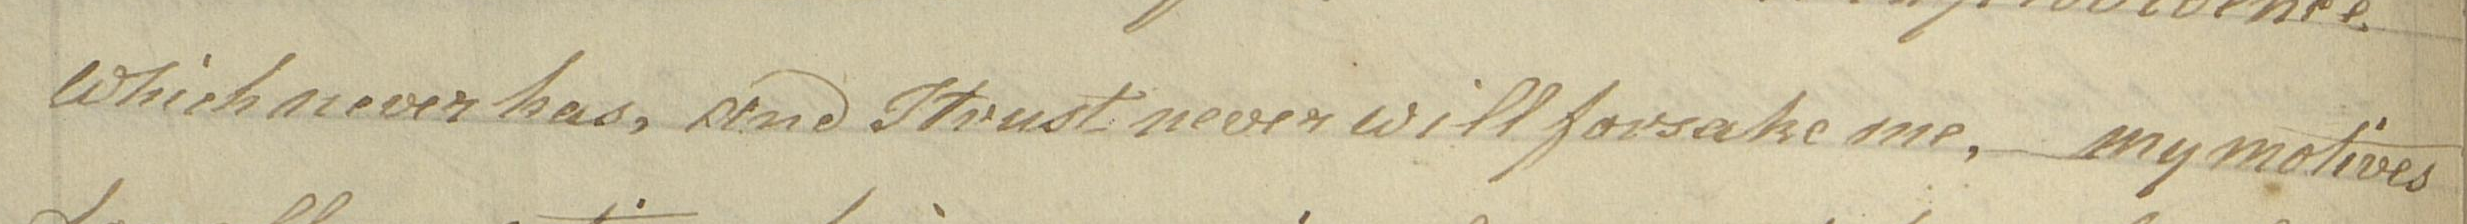which never has, and I trust never will forsake me, my motives
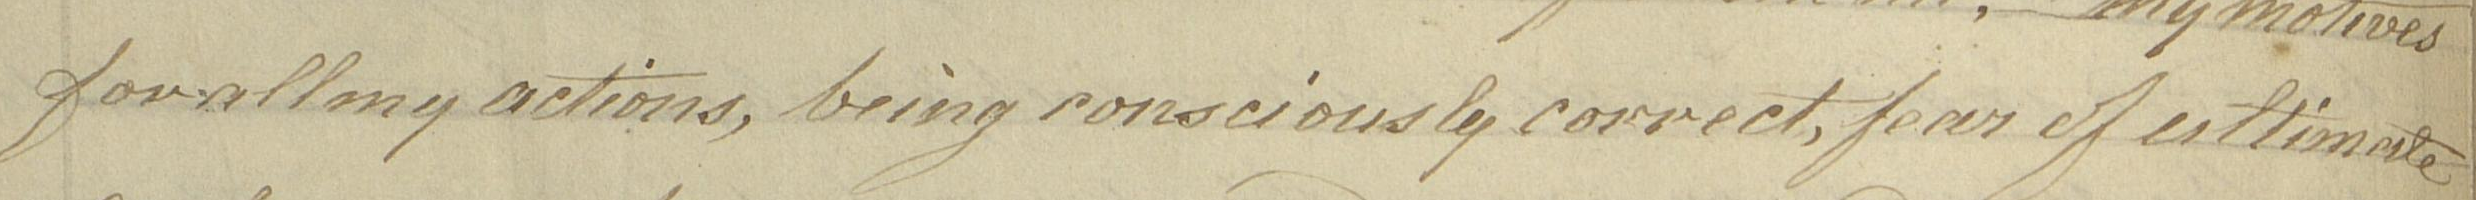for all my actions, being consciously correct, four of ultimate
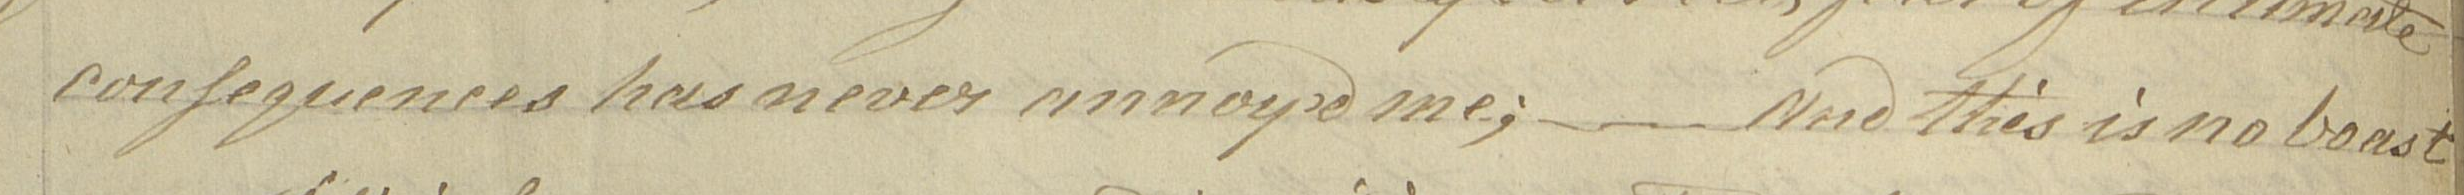consequences has never annoyd me; And this is no boast
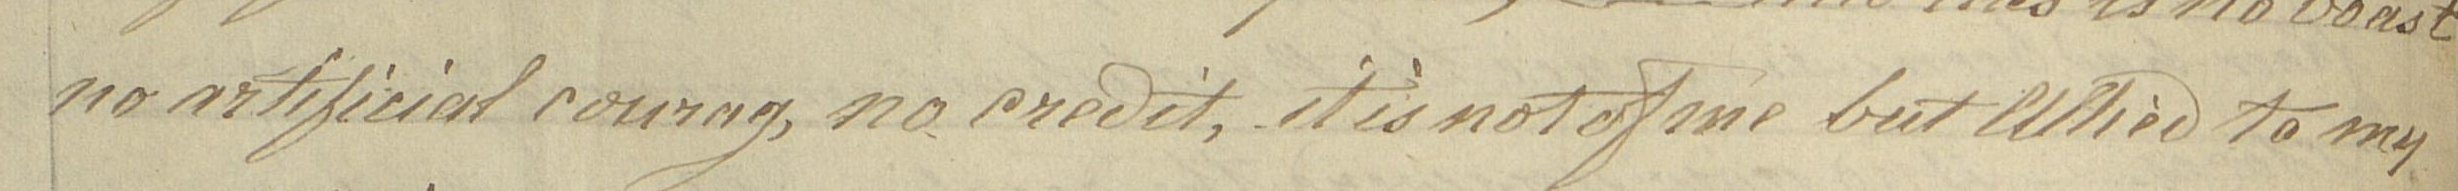no artificial courag, no credit, it is not of me but Allied to my
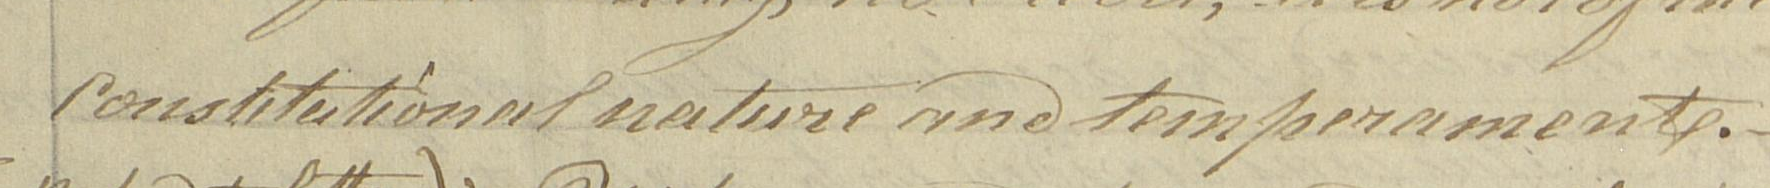constitutional nature and temperament.
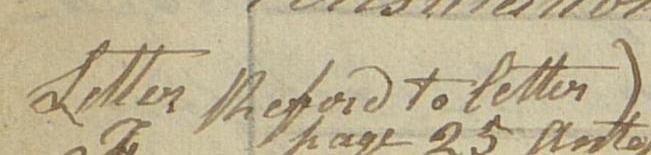Letter Repord to letter
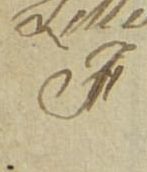F
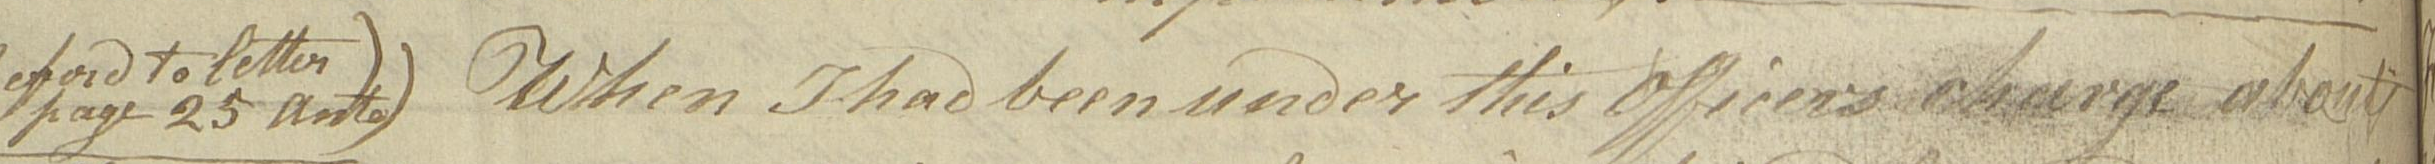page 25 Ante When I had been under this Officers charge about
